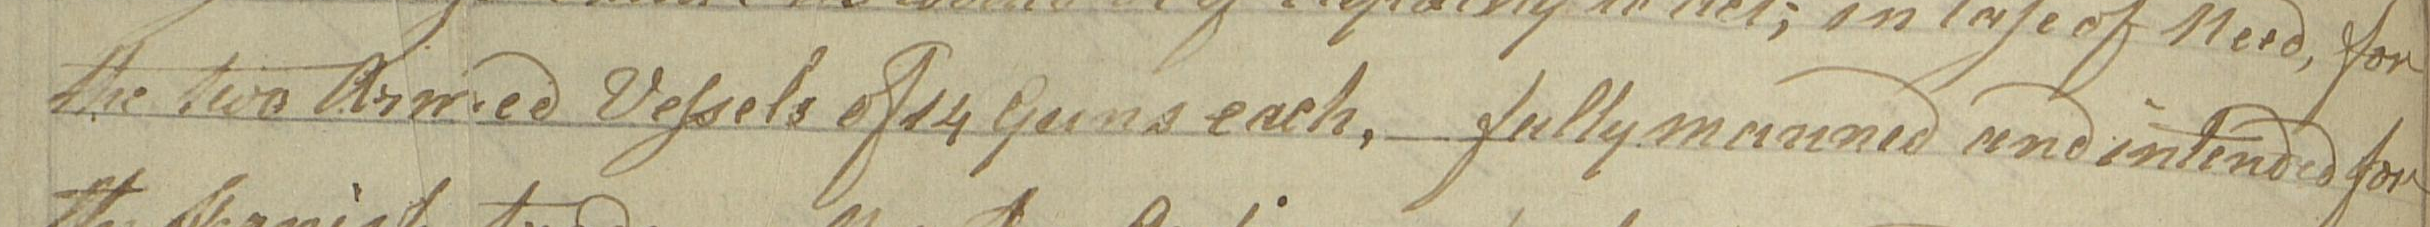the two Armed Vessels of 14 Guns each, fully manned and intended for
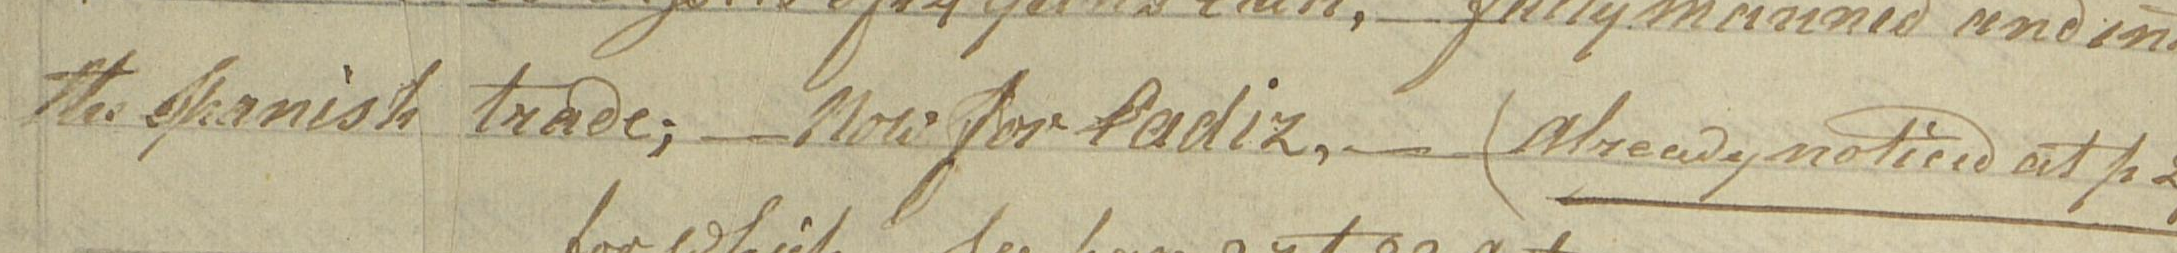to spanish trade; Now for Cadiz, (already noticed at p27)
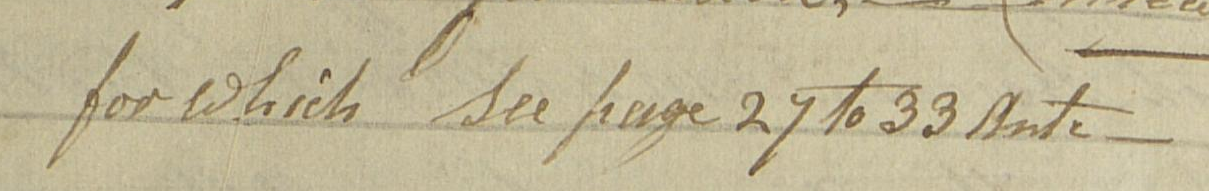for which See page 27 to 33 Ante
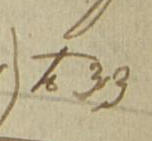to 33
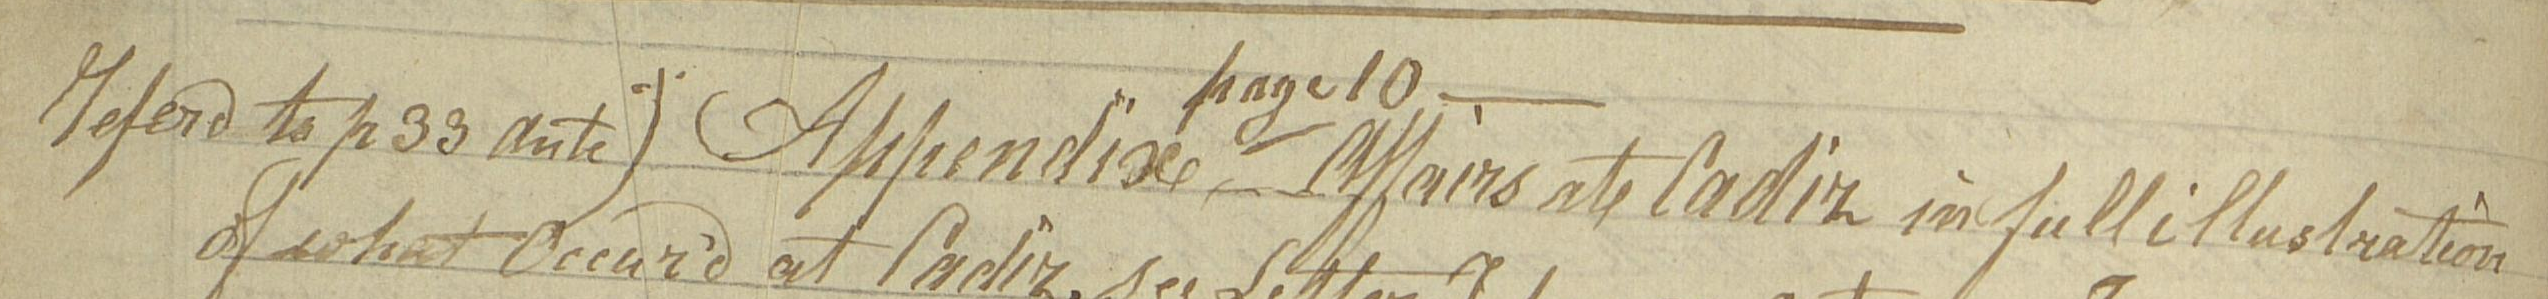Referd to p33 Ante) Appendix ^ Affairs at Cadiz in full illustration
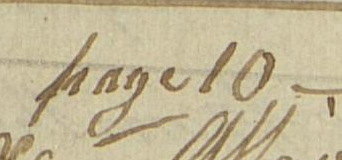page 10
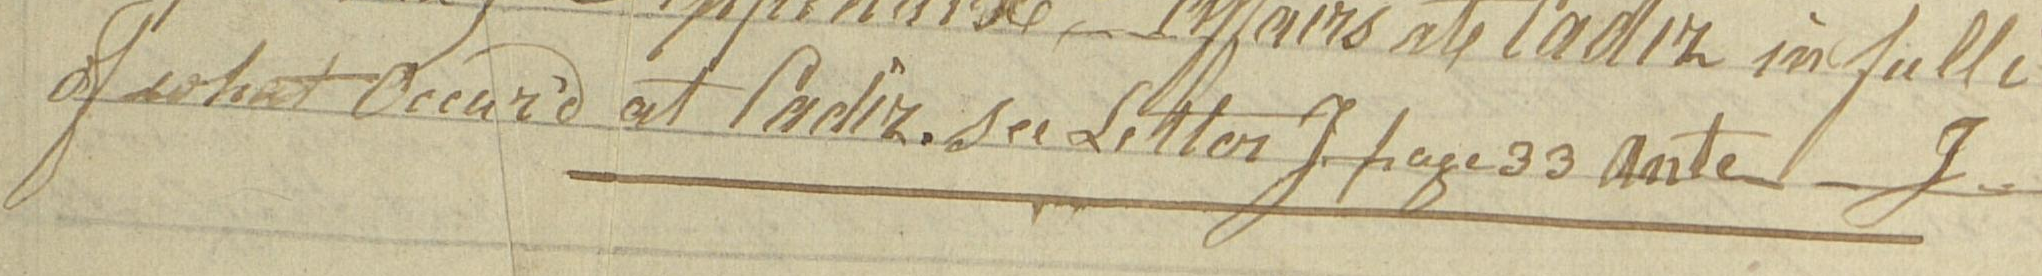of what Occur'd at Cadiz. See Letter J page 33 ante J
